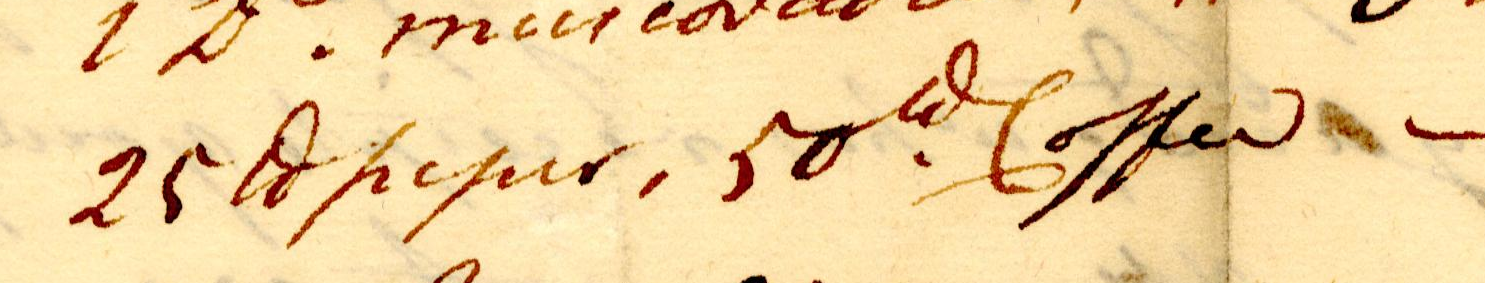25 ld peper, 50 ^ld Coffee-
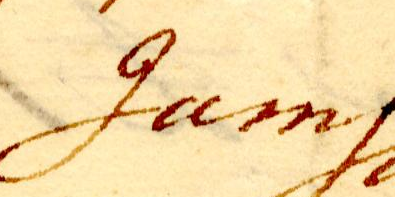I am
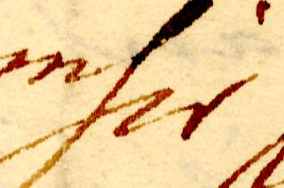Sir
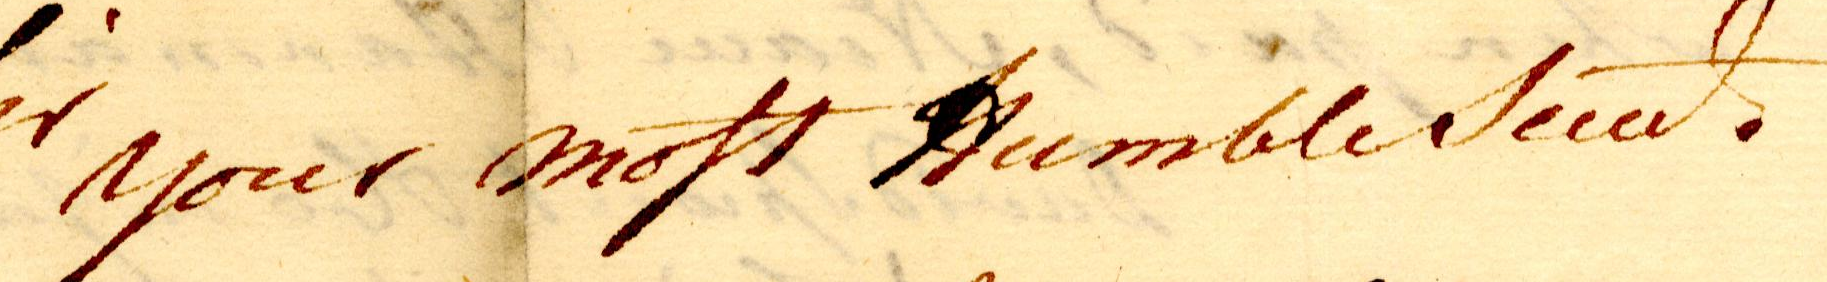your most Humble Serv^t.
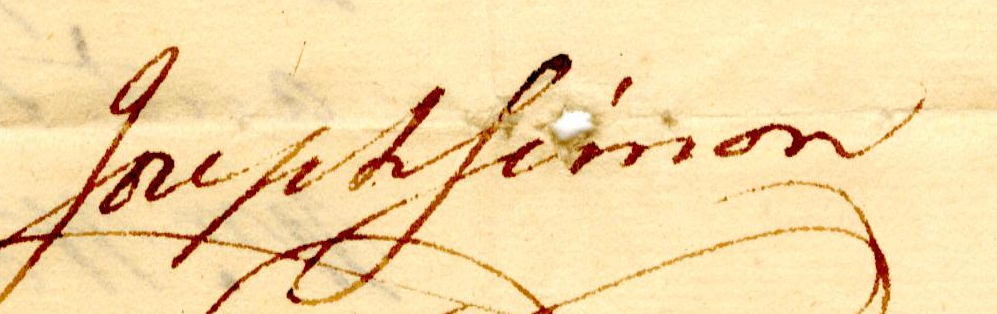Joseph Simon
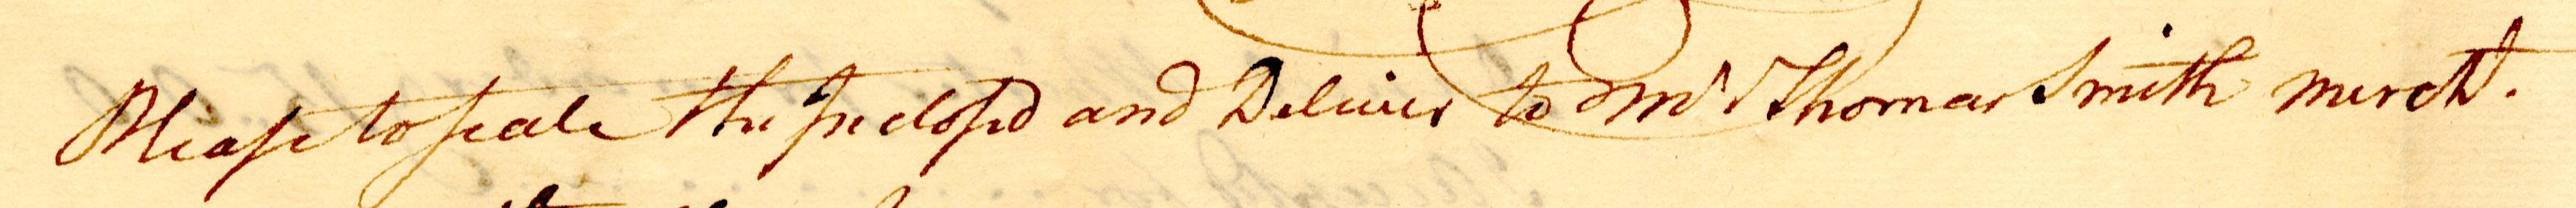Please to seale the inclosed and Deliver to M^r Thomas Smith merch^t
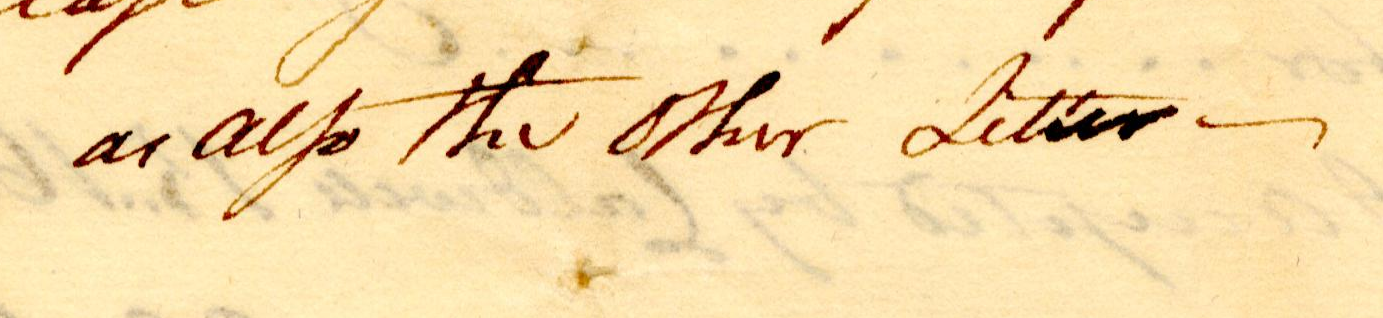as also the other Letter-
